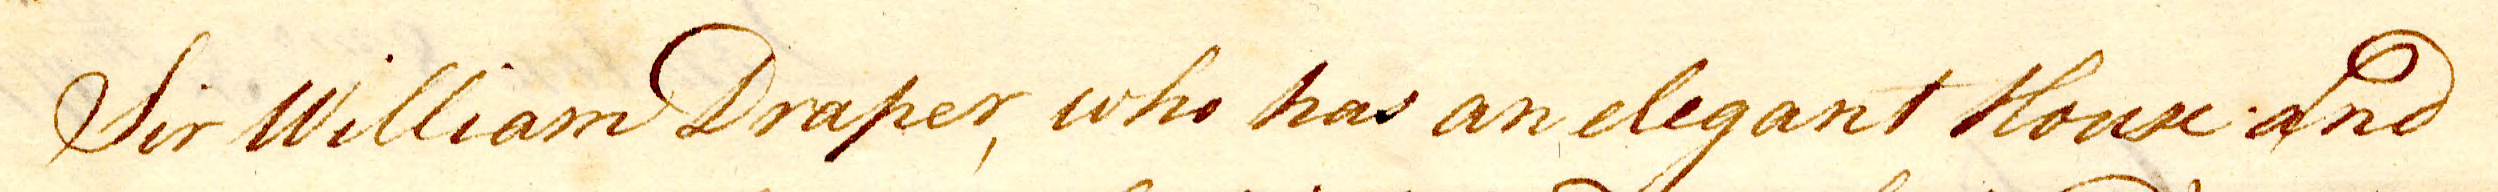Sir William Draper, who has an elegant House and
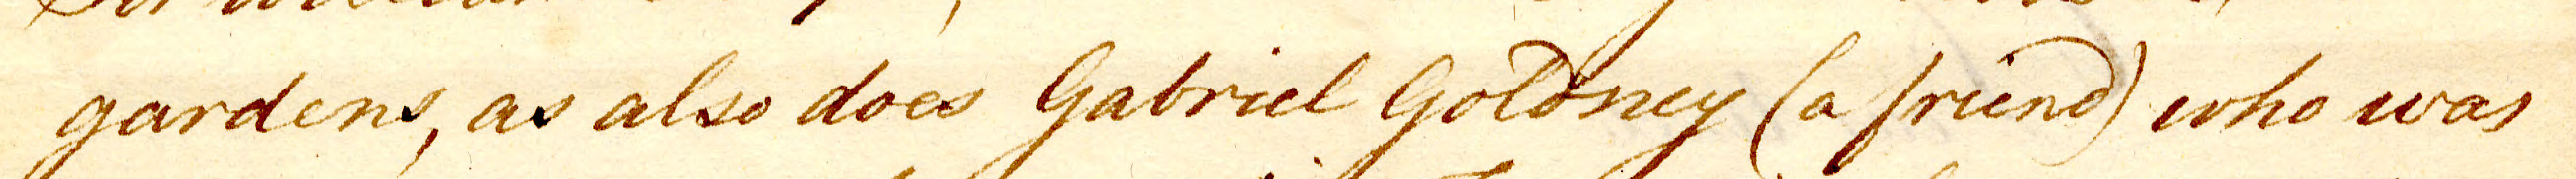gardens, as also does Gabriel Goldney (a friend) who was
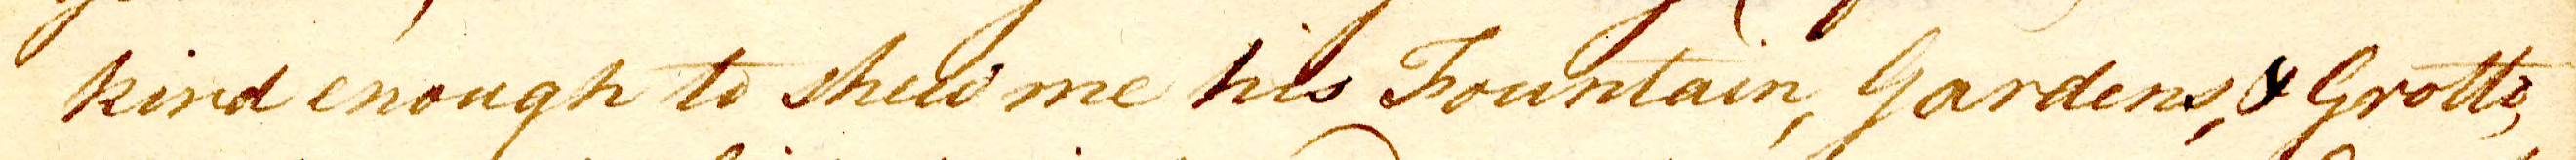kind enough to shew me his Fountain, Gardens, & Grotto,
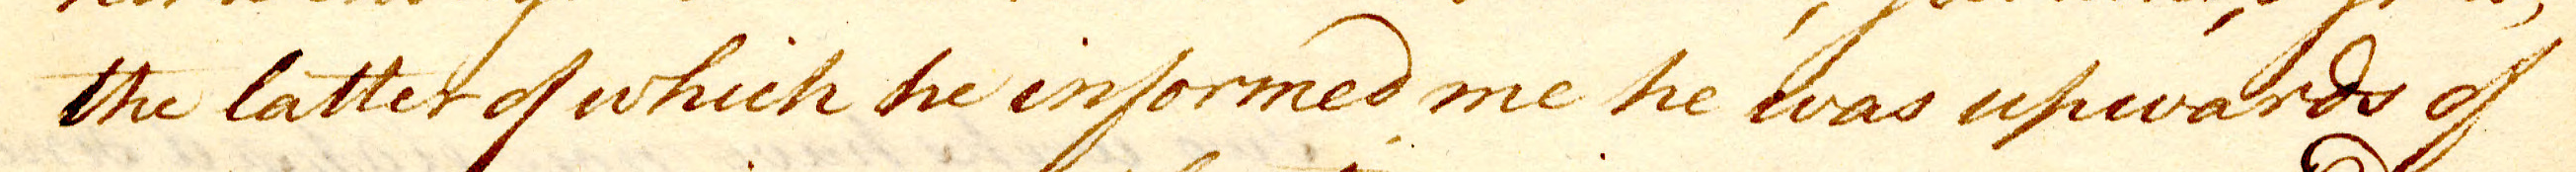the latter of which he informed me he was upwards of
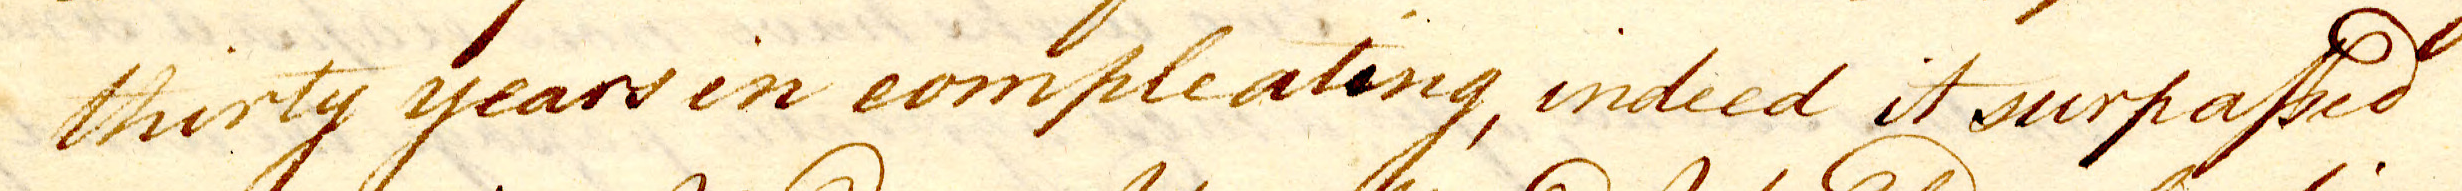thirty years in compleating, indeed it surpassed
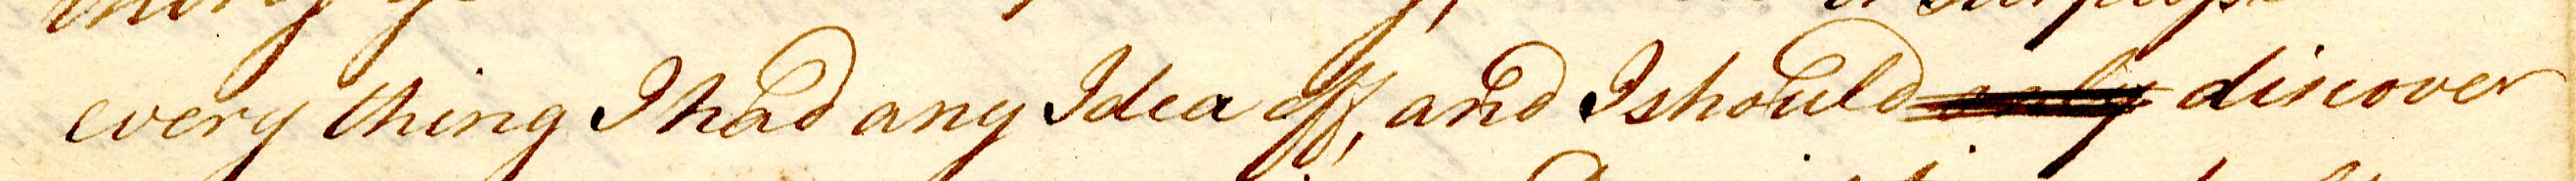every thing I had any Idea off, and I should [only] discover
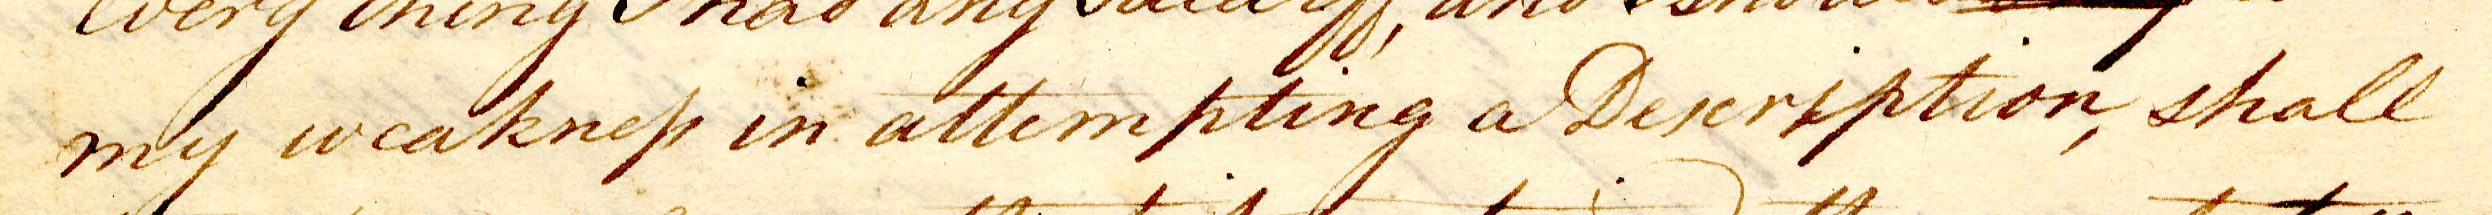my weakness in attempting a Description, shall
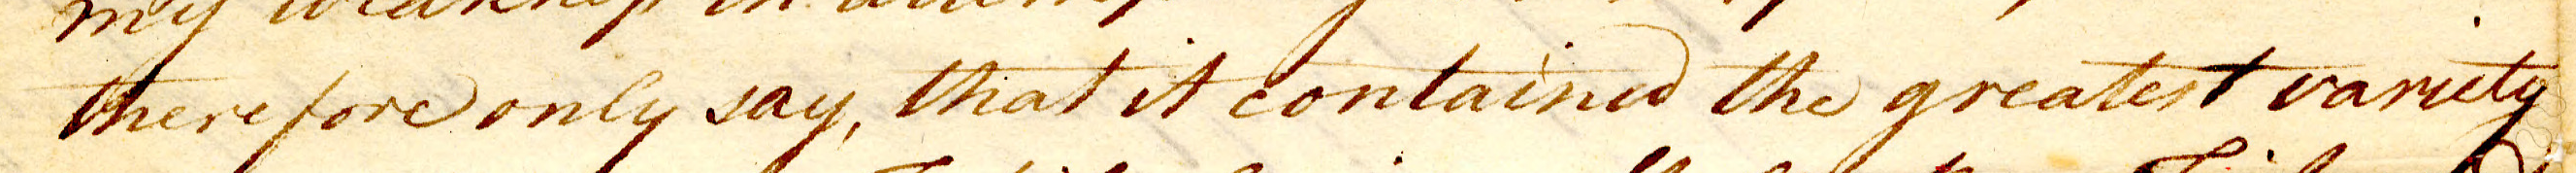therefore only say, that it contained the greatest variety
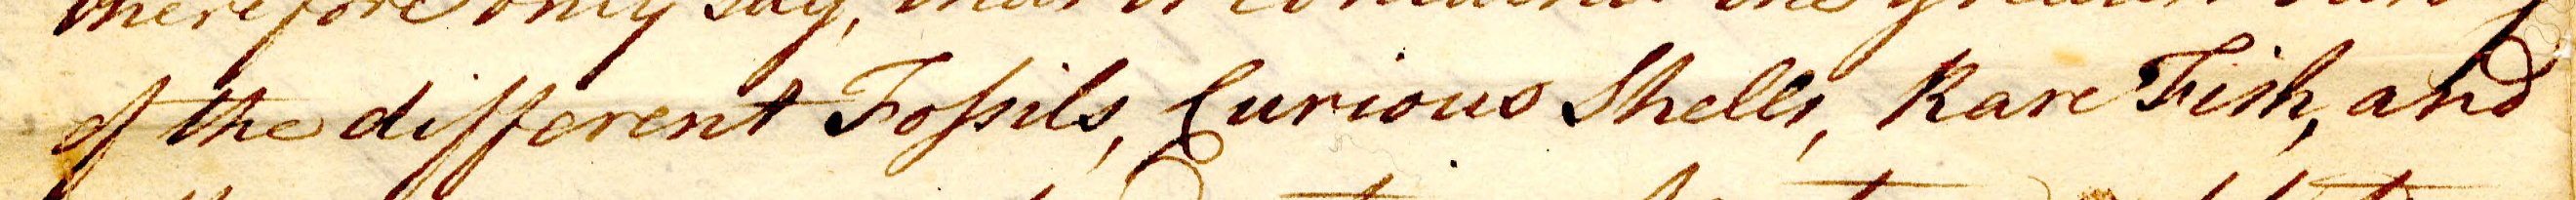of the different Fossils, Curious Shells, Rare Fish, and
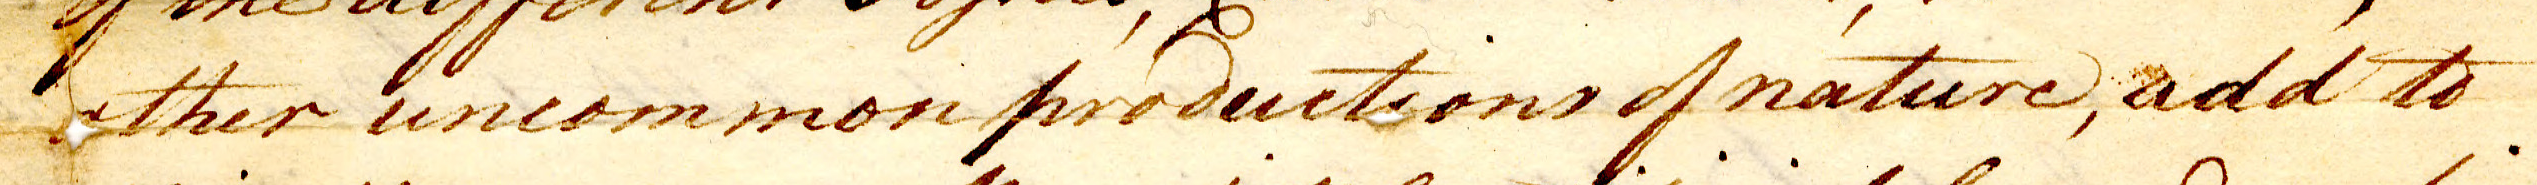other uncommon productions of nature, add to
